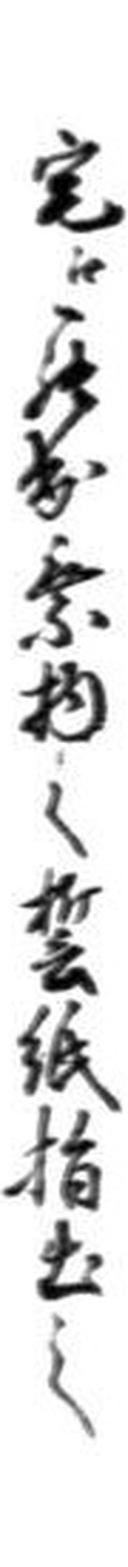宅江罷出乗物之誓紙指出之
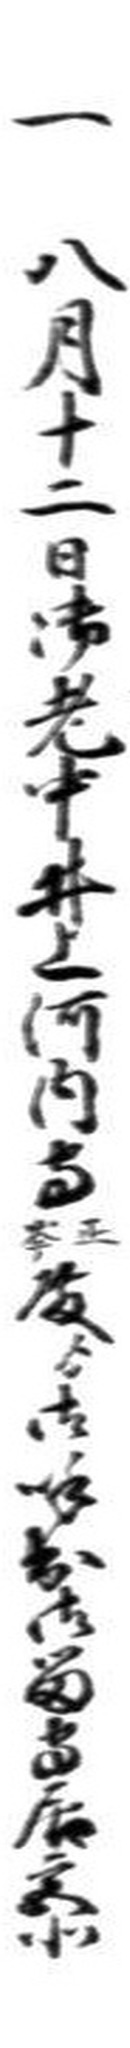一八月十二日御老中井上河内守正岑殿ゟ御呼出御留守居宮北
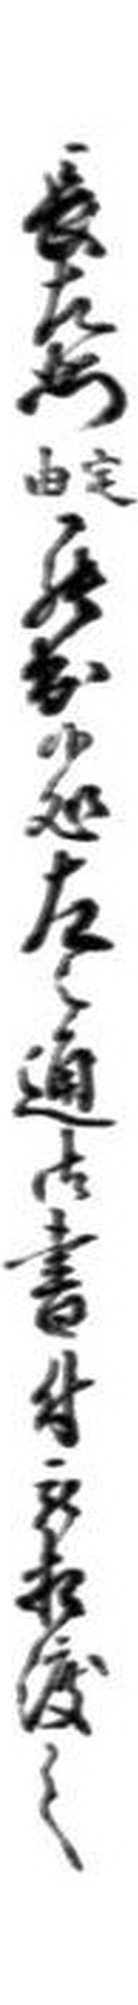長左衛門定由罷出候処左之通御書付被相渡之
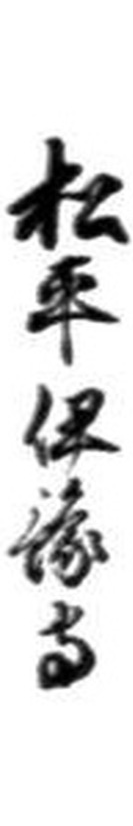松平伊予守
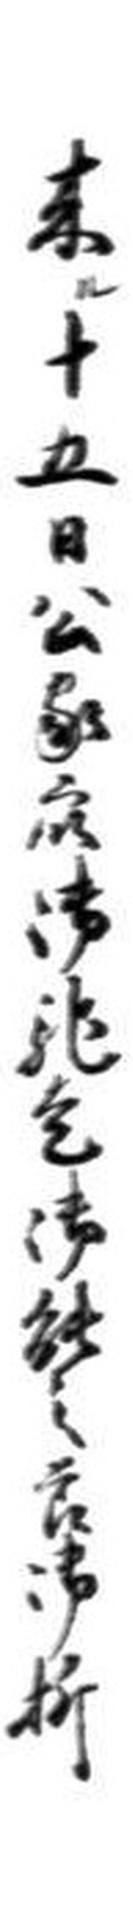来ㇽ十五日公家衆御馳走御能之節御折

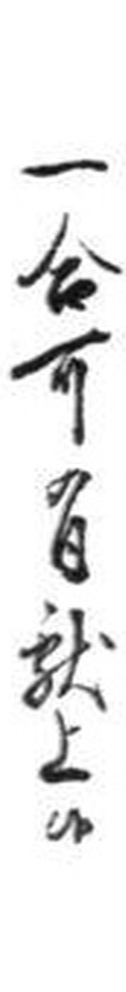一合可有献上候
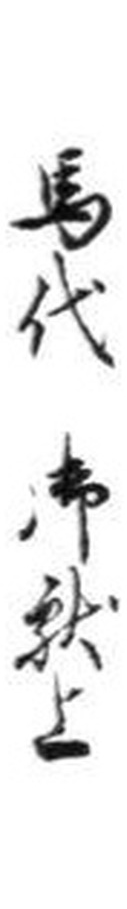馬代御献上
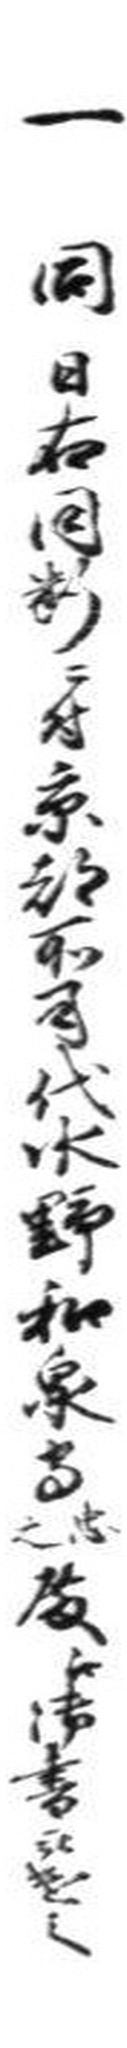一同日右同断ニ付京都所司代水野和泉守忠之殿江御書被遣之
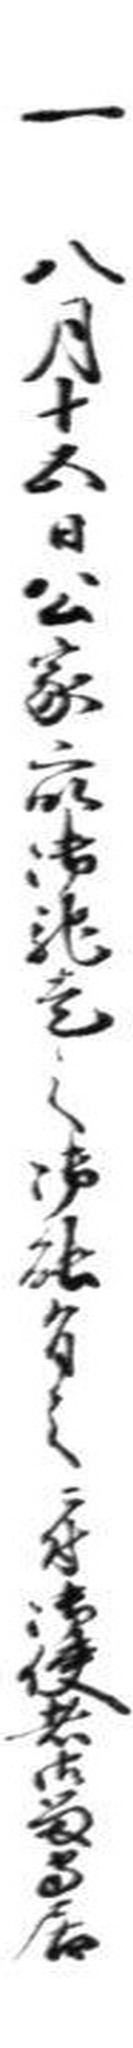一八月十五日公家衆御馳走之御能有之ニ付御使者御留守居
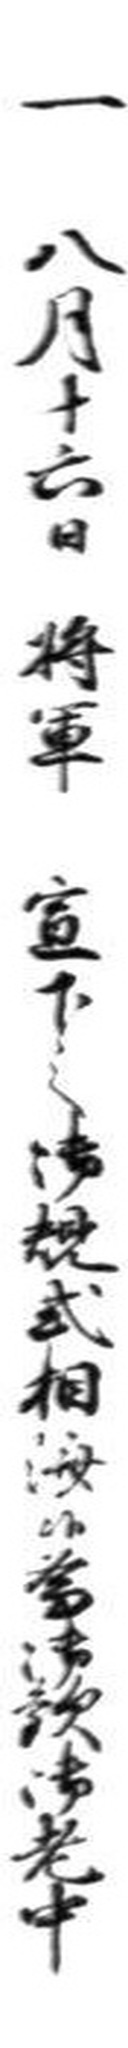一八月十六日将軍宣下之御規式相済候為御歓御老中
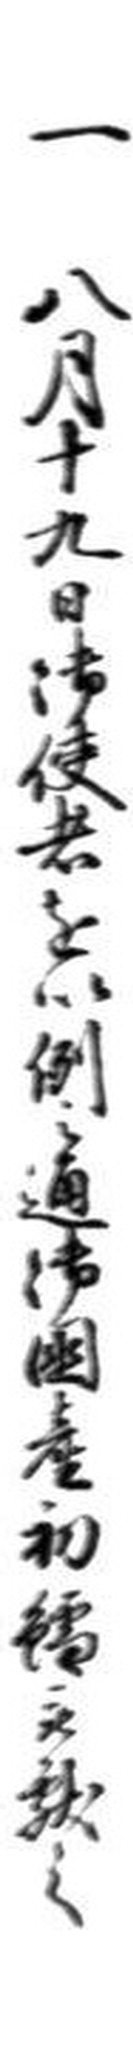一八月十九日御使者を以例之通御国産初鱈被献之
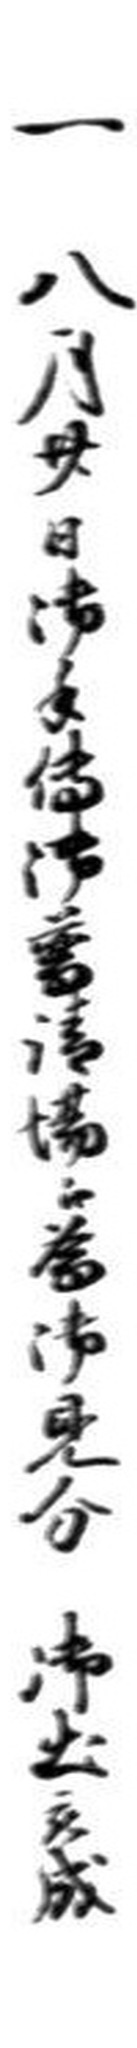一八月廿日御手伝御普請場江為御見分御出被成
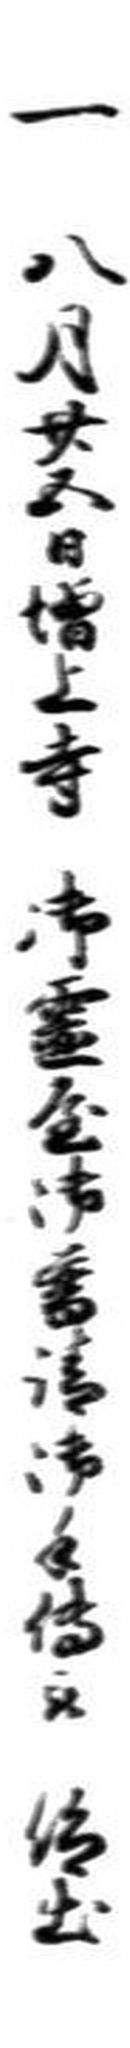一八月廿五日増上寺御霊屋御普請御手伝被仰出
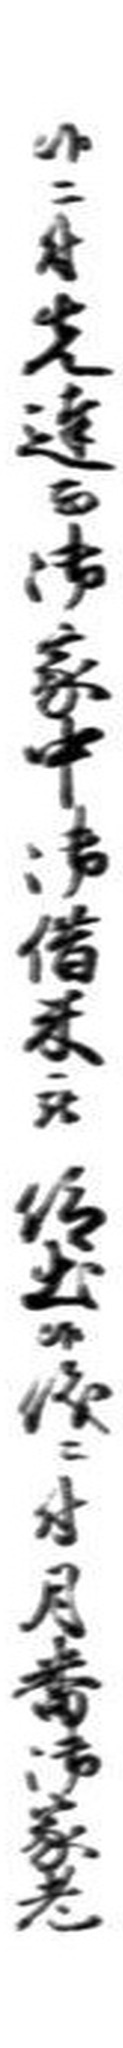候ニ付先達而御家中御借米被仰出候儀ニ付月番御家老
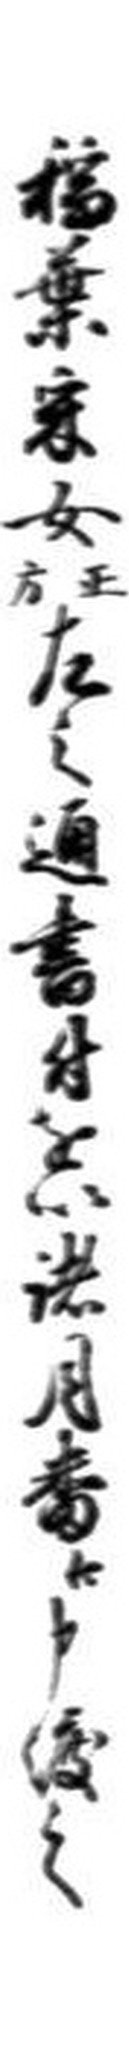稲葉宋女正方左之通書付を以諸月番江申渡之
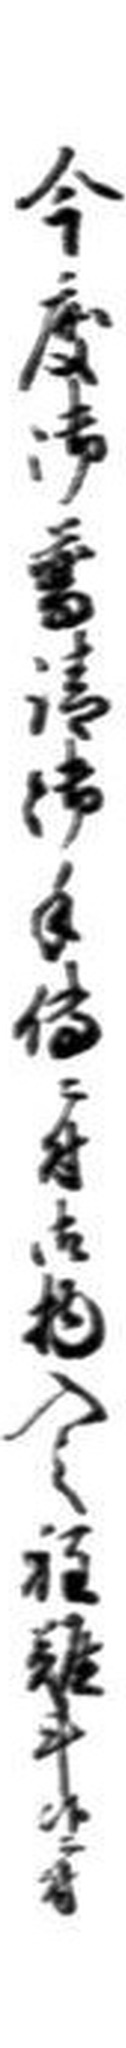今度御普請御手伝ニ付御物入之程難計候ニ付
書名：家譜 三十一 吉邦公 享保元年
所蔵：福井県文書館 Fukui Prefectural Archives
